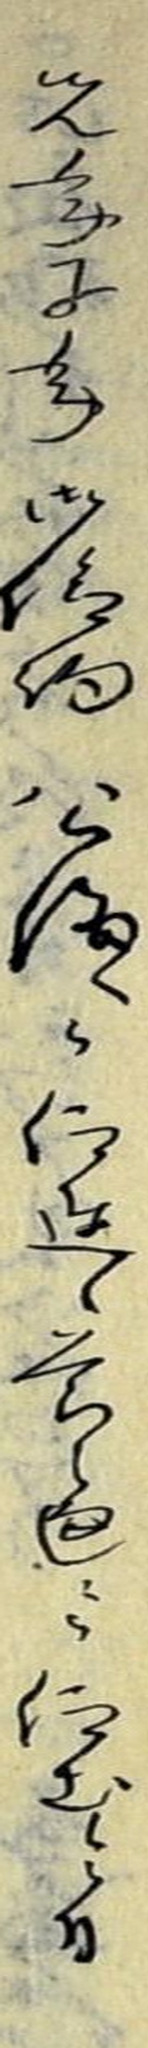先年刁年御倹約公儀へ被仰達候節之通に被仰出候に付
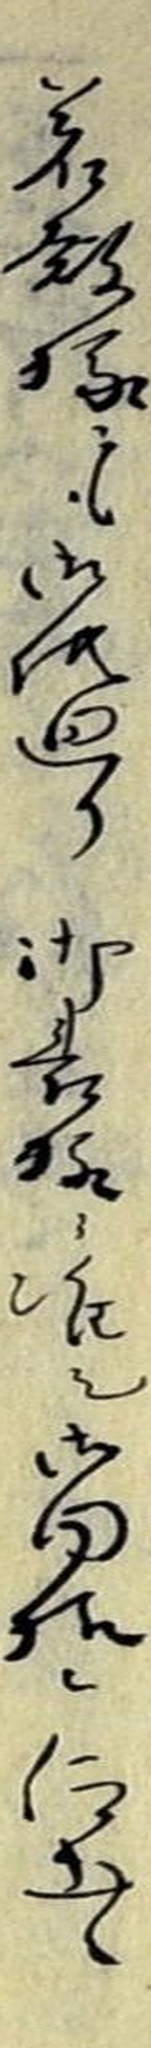若殿様にも御供廻り御表様に准し御同様被仰出候
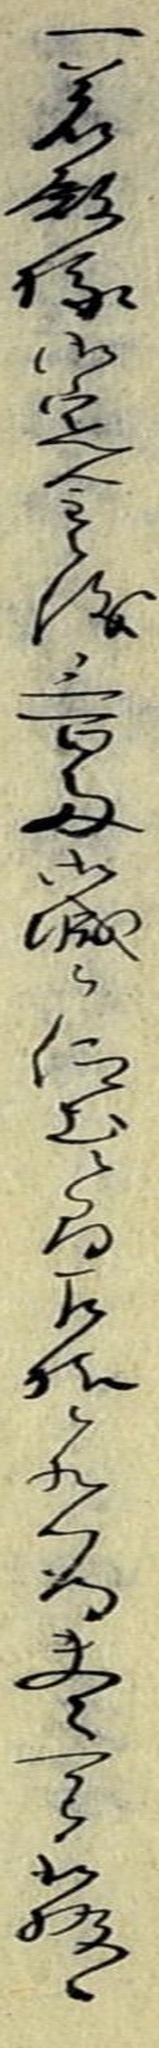一若殿様御定金之儀三百両御減被仰出候間左様被相心得夫々可被取扱候
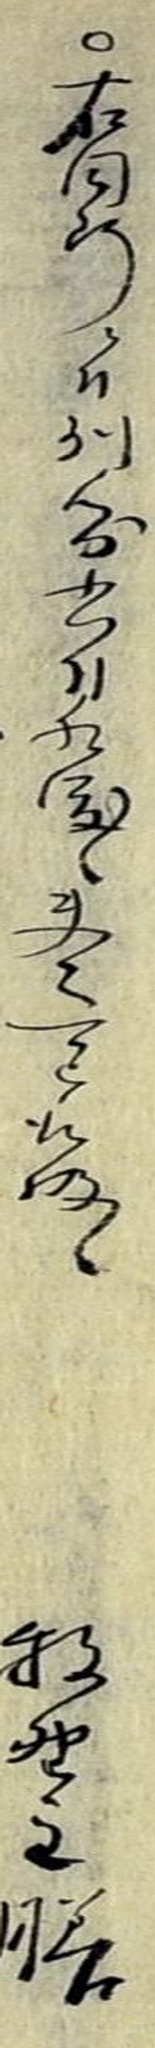〇右同断に付別紙書付相渡候夫々可被取扱候牧野主膳
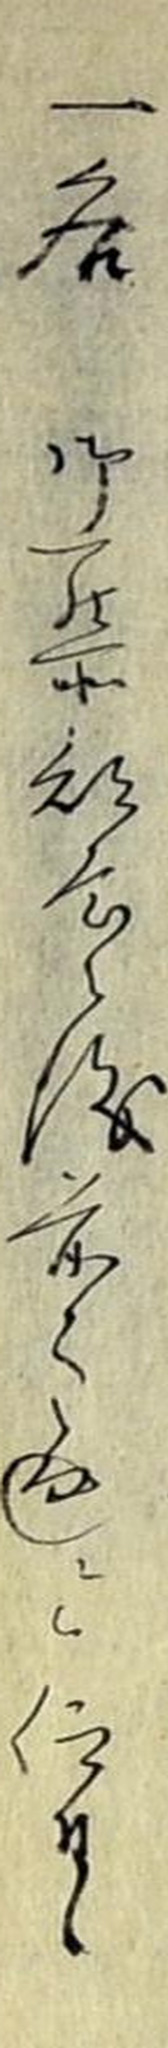一各御座所部屋之儀前々之通に被仰付候
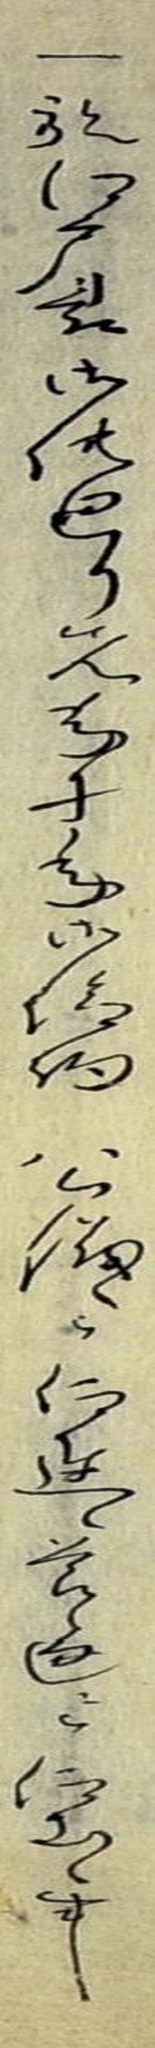一於江戸表御供廻り先年刁年御倹約公儀へ被仰達候節之通に被仰出候事
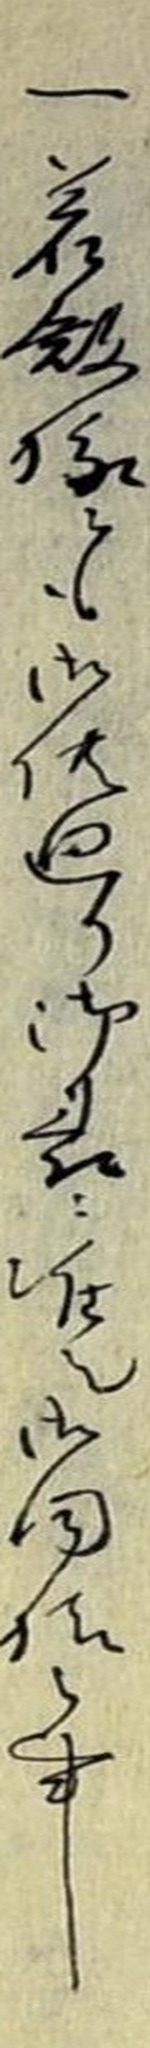一若殿様にも御供廻り御表に准し御同様之事
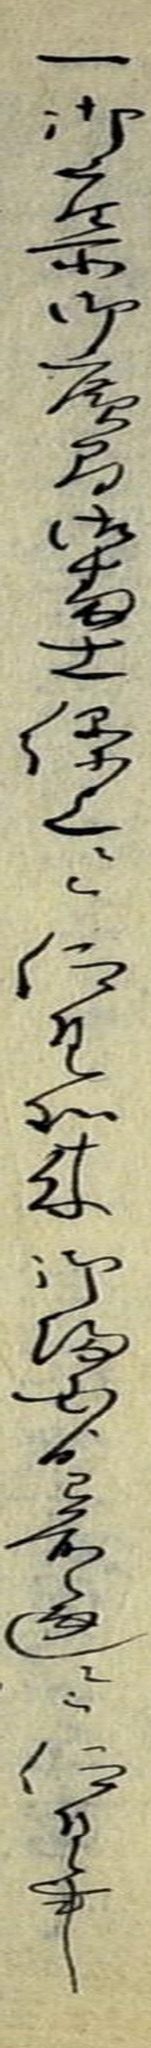一御座所御広間御番士繰上に被仰付候処来御帰国ゟ已前之通に被仰付候事
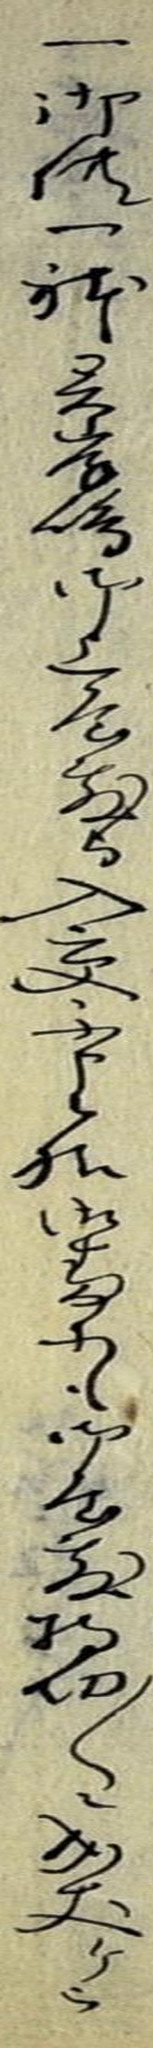一御供一躰霊岸嶋御上屋敷与入交不申候様御番等も御屋敷持切〳〵に成丈ヶ被
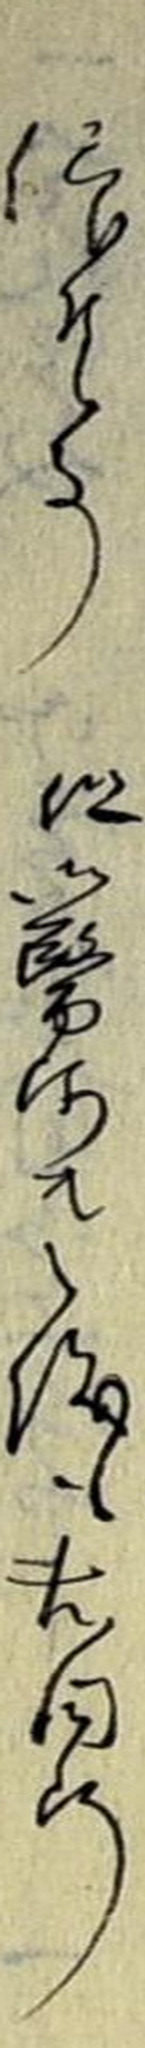仰付候事但御医師共之儀も右同断
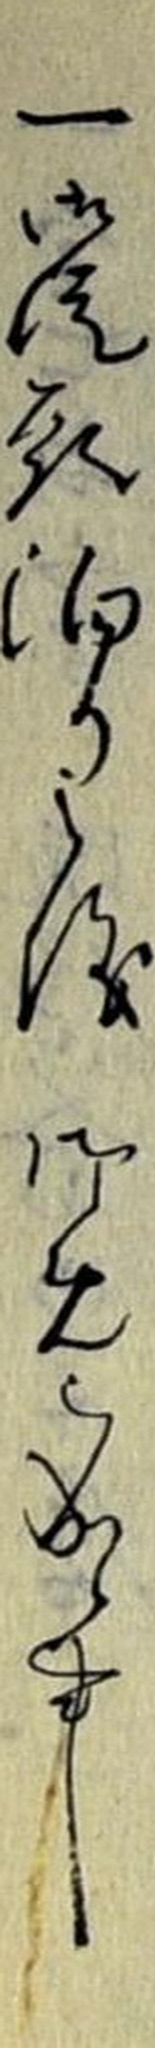一御徒頭泊り之儀御免被成候事
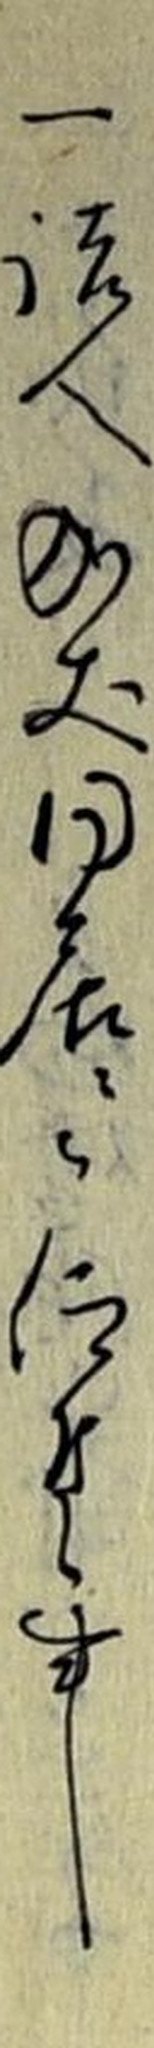一詰人成丈同居に被仰付候事
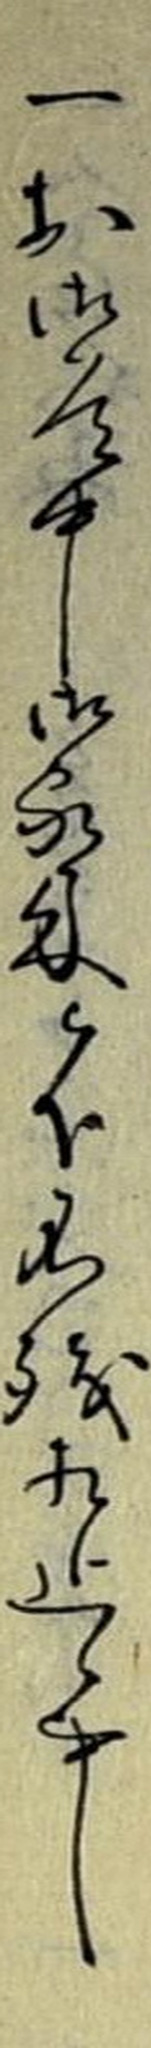一於御道中御家来被下不残相止候事
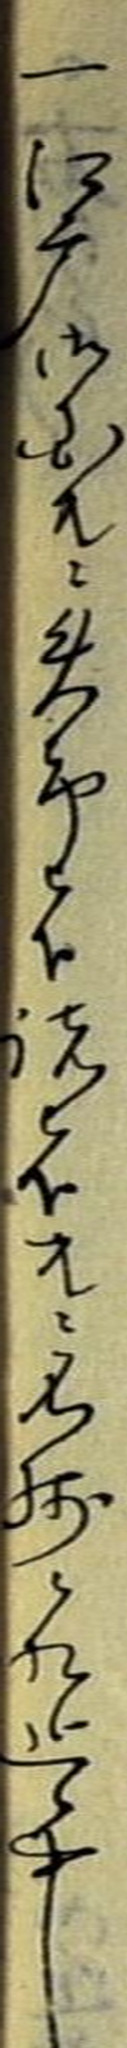一江戸御国元に失却被下諸被下共に不残被相止候事
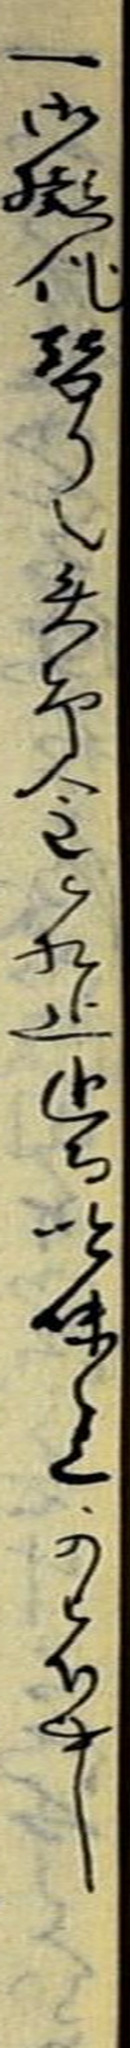一御擬作替り之失却金被相止追而吟味之上可被下事
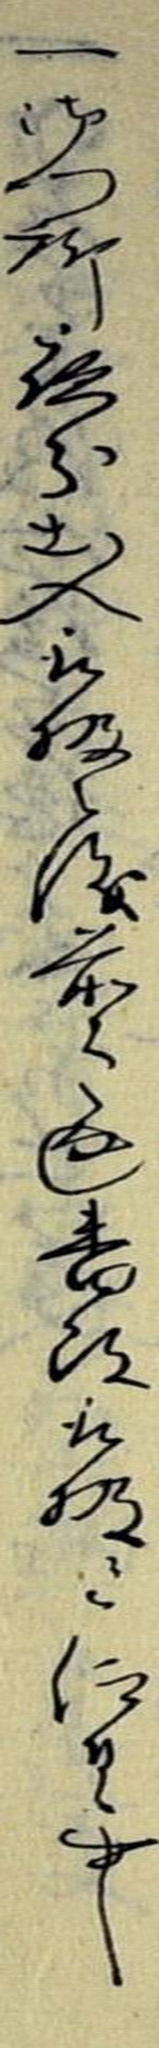一御門所夜分出入取扱之儀前々之通番改取扱に被仰付候事
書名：命令之部 二
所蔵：福井県文書館 Fukui Prefectural Archives
